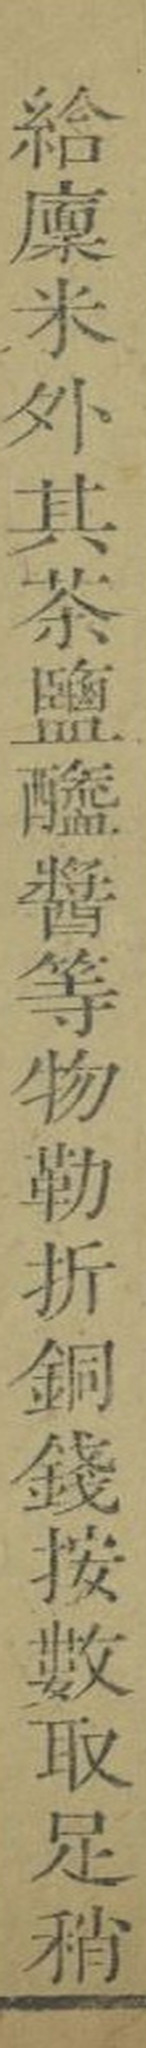給廩米外其茶塩醯醤等物勒折銅銭按数取足稍
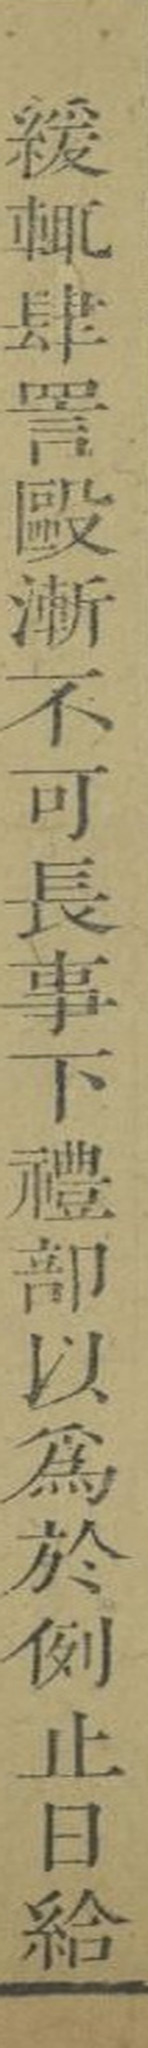緩輒肆詈殴漸不可長事下礼部以為於例止日給
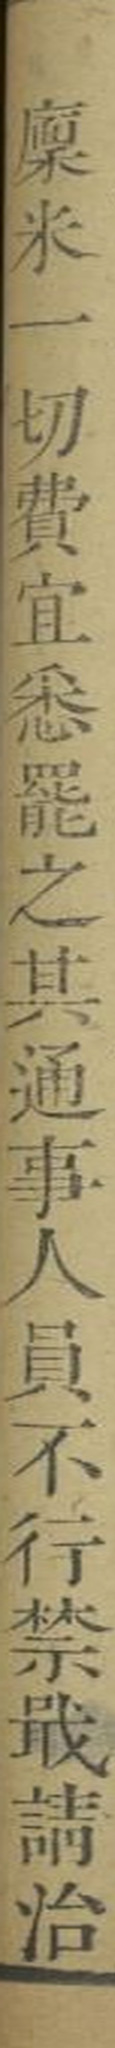廩米一切費宜悉罷之其通事人員不行禁戢請治
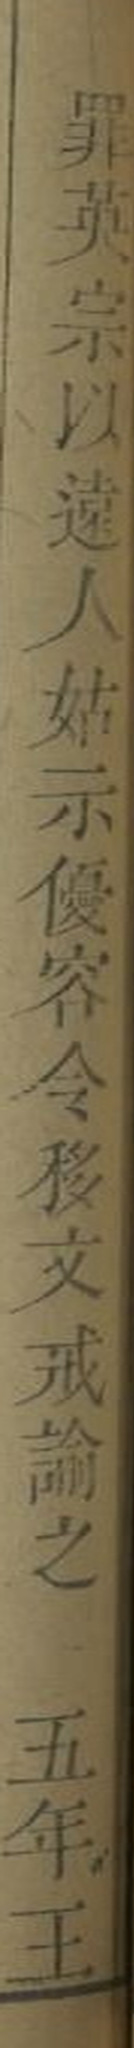罪英宗以遠人姑示優容令移文戒諭之五年王
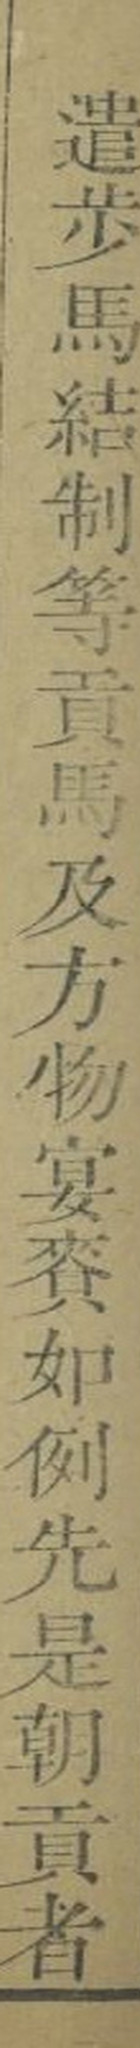遣歩馬結制等貢馬及方物宴賚如例先是朝貢者
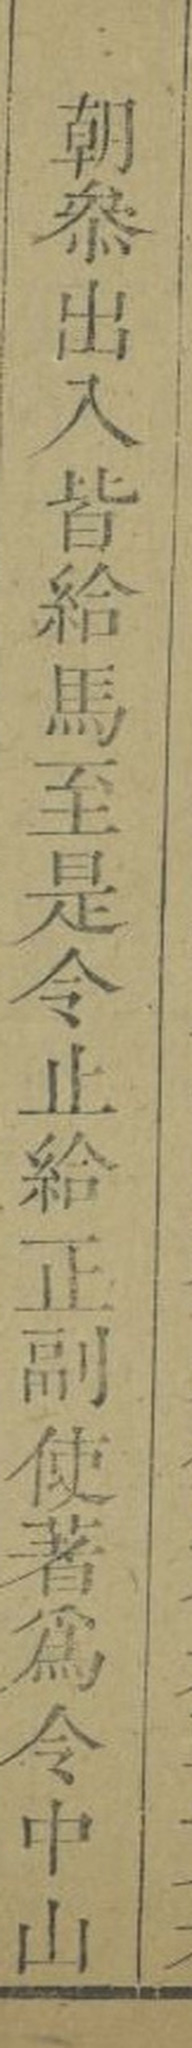朝参出入皆給馬至是令止給正副使著為令中山
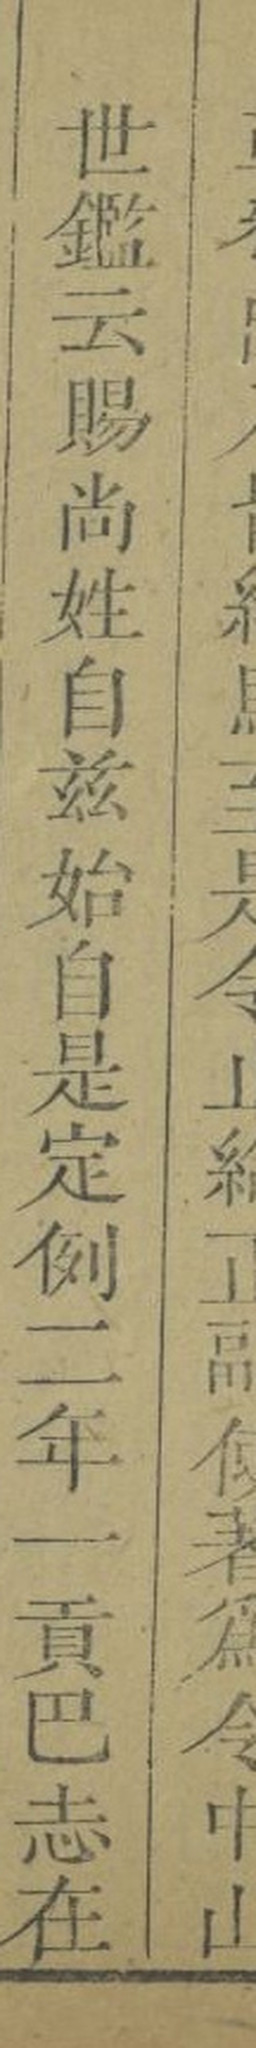世鑑云賜尚姓自茲始自是定例二年一貢巴志在
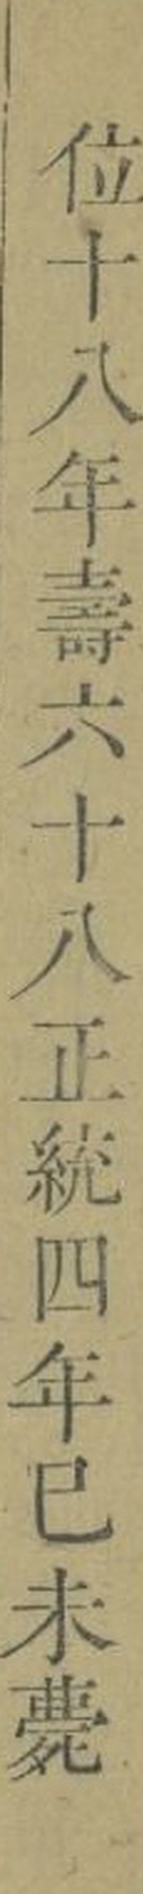位十八年寿六十八正統四年巳未薨
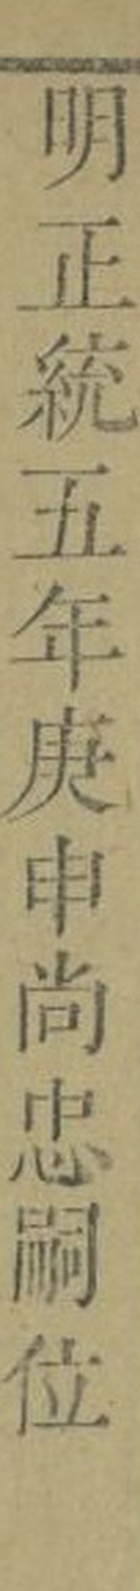明正統五年庚申尚忠嗣位
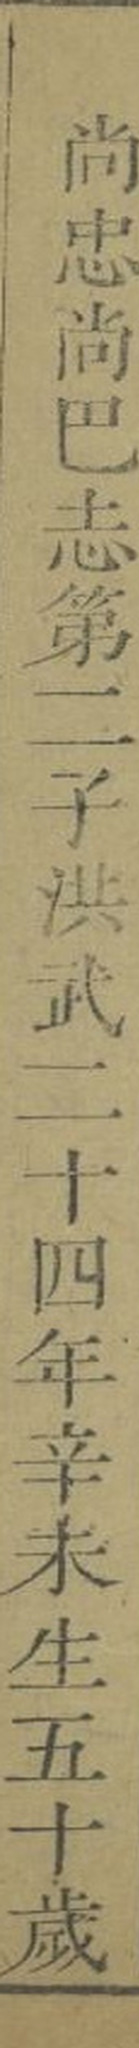尚忠尚巴志第二子洪武二十四年辛未生五十歳
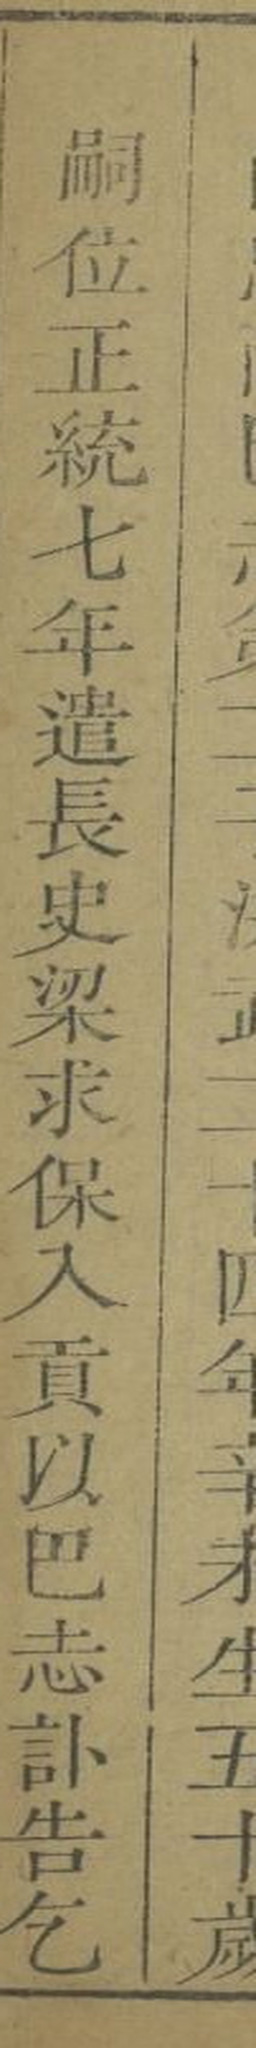嗣位正統七年遣長史梁求保入貢以巴志訃告乞

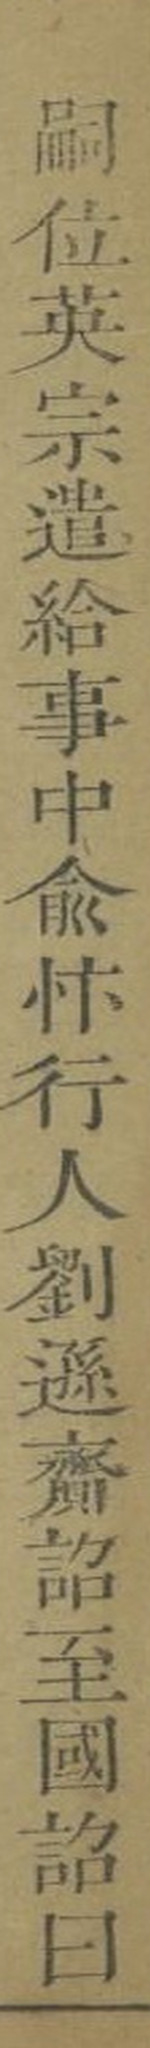嗣位英宗遣給事中兪忭行人劉遜齎詔至国詔曰
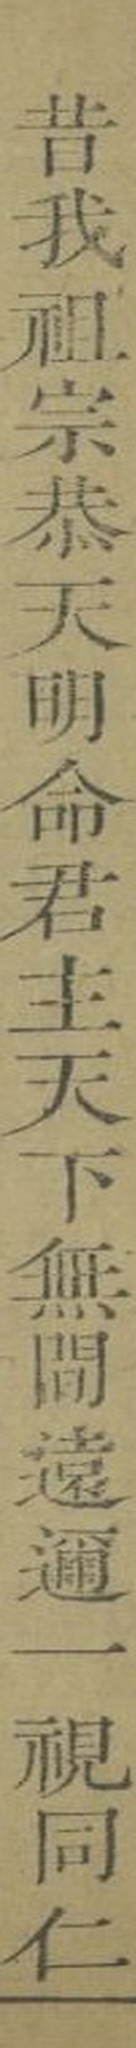昔我祖宗恭天明命君主天下無間遠邇一視同仁
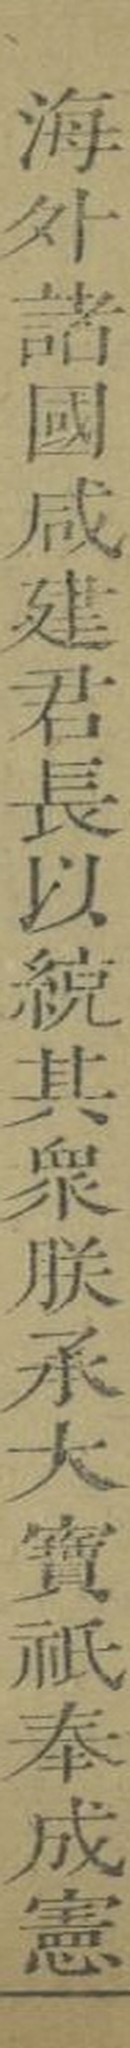海外諸国咸建君長以統其衆朕承大宝祇奉成憲
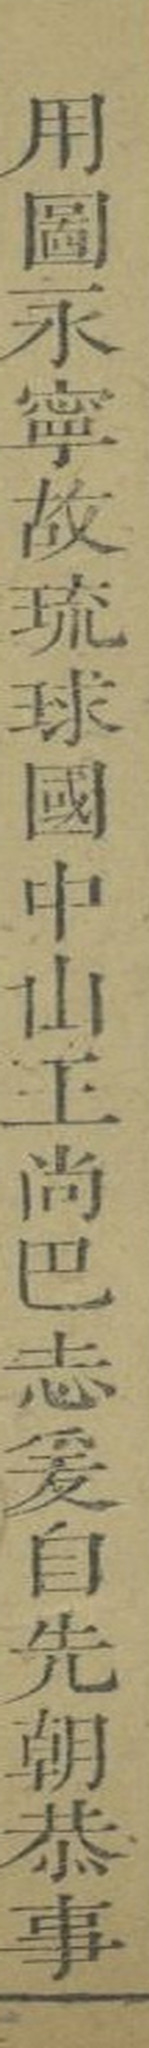用図永寧故琉球国中山王尚巴志爰自先朝恭事
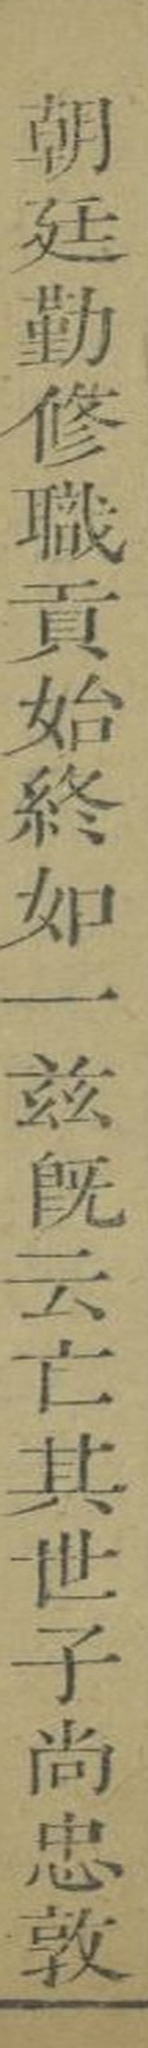朝廷勤修職貢始終如一茲既云亡其世子尚忠敦
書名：中山伝信録 巻三
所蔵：University of the Ryukyus Library
